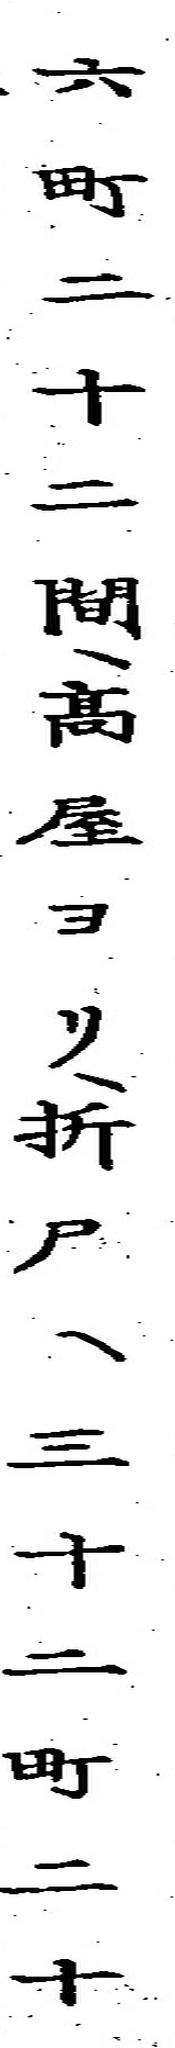六町二十二間、高屋ヨリ、折戸ヘ三十二町二十
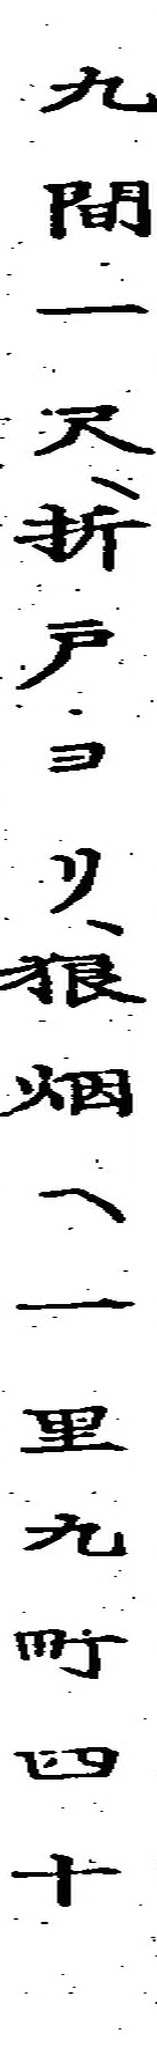九間一尺、折戸ヨリ、狼煙ヘ一里九町四十
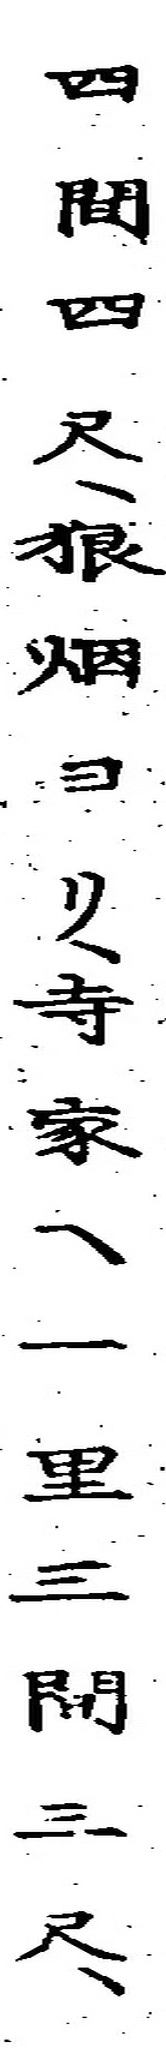四間四尺、狼煙ヨリ、寺家ヘ一里三間三尺、
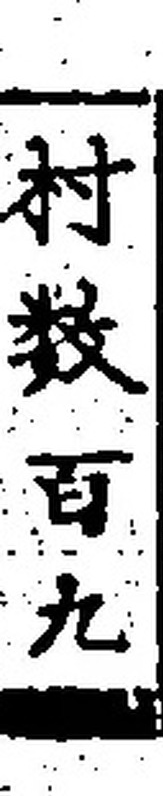村数百九
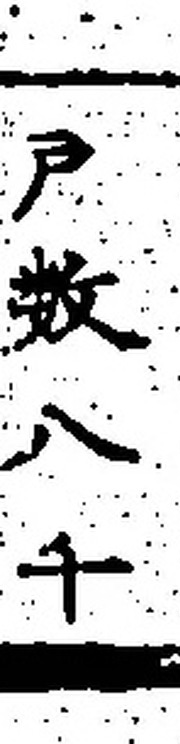戸数八千
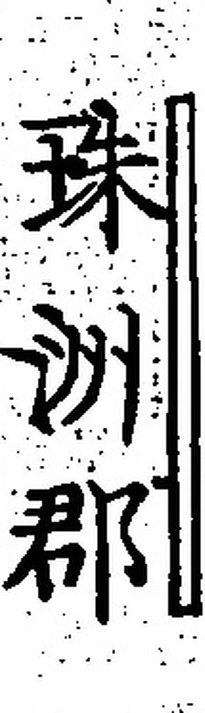珠洲郡
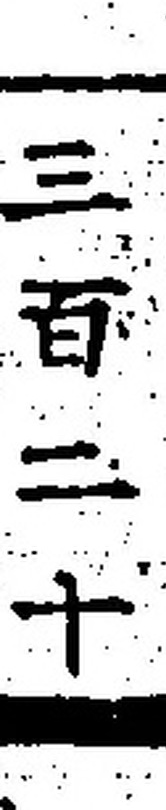三百二十
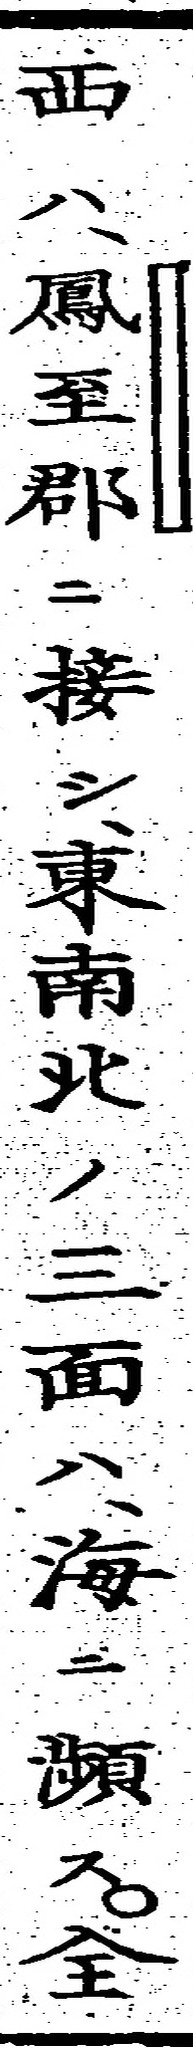西ハ、鳳至郡ニ接シ、東南北ノ三面ハ、海ニ瀕ス。全
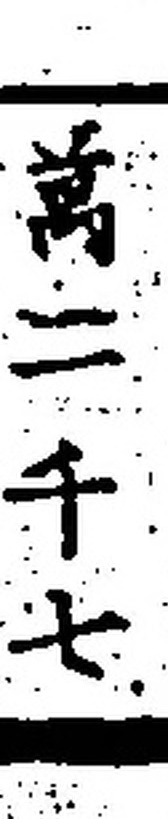万二千七
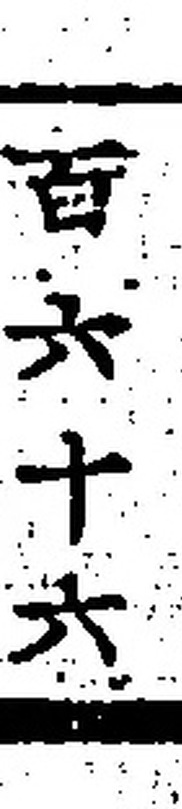百六十六
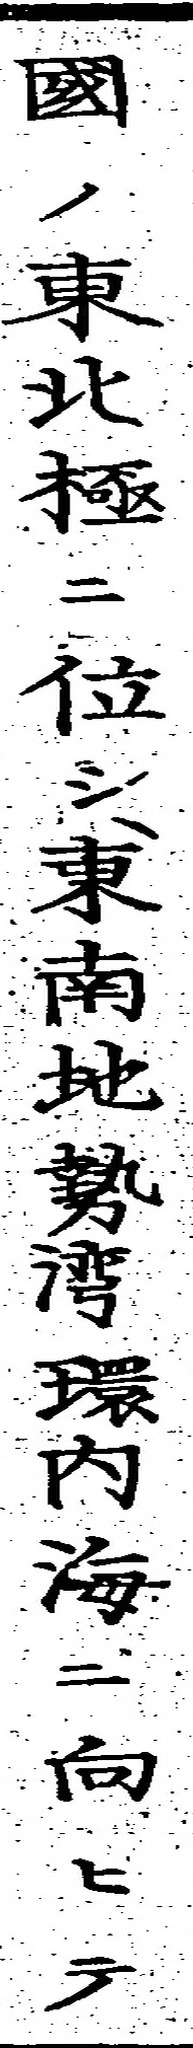国ノ東北極ニ位シ、東南地勢湾環内海ニ向ヒテ
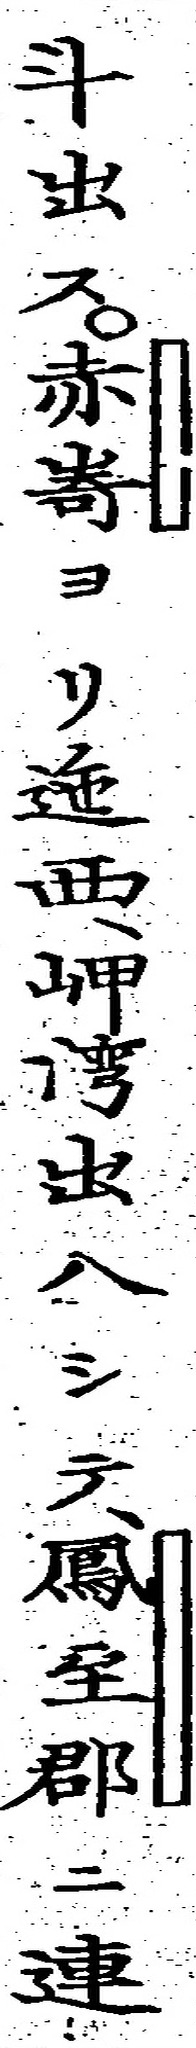斗出ス。赤崎ヨリ迤西、岬湾出入シテ、鳳至郡ニ連
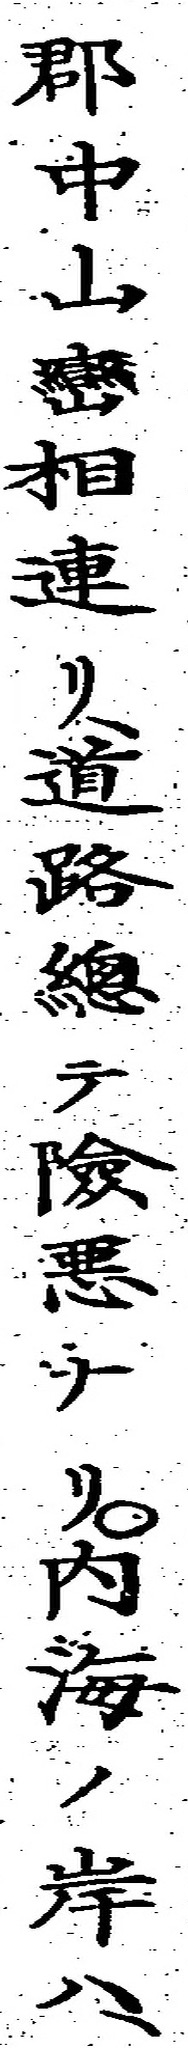郡中山巒相連リ、道路総テ険悪ナリ。内海ノ岸ハ、
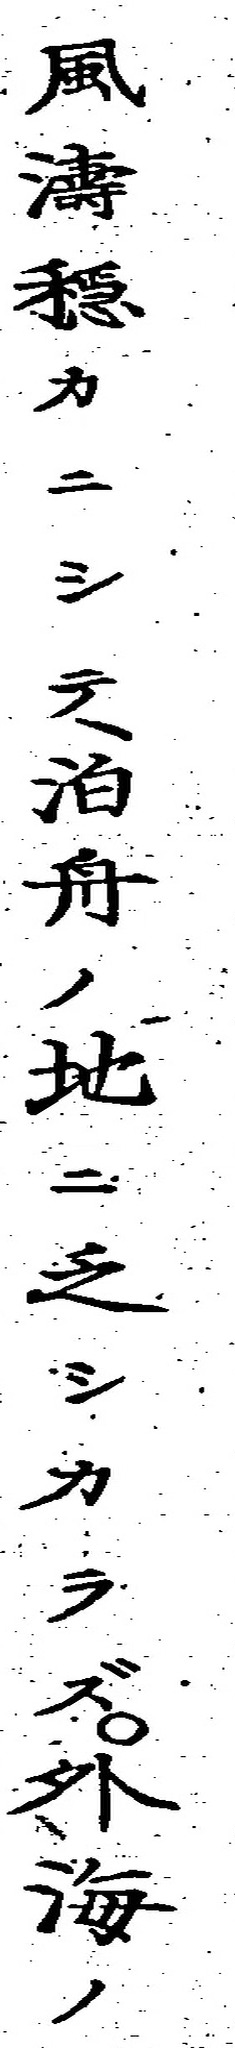風濤穏カニシテ、泊舟ノ地ニ乏シカラズ。外海ノ
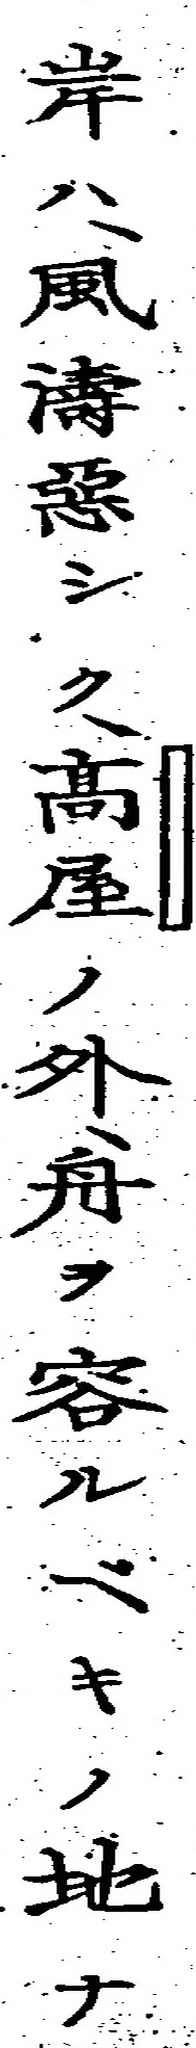岸ハ、風濤悪シク、高屋ノ外、舟ヲ容ルベキノ地ナ

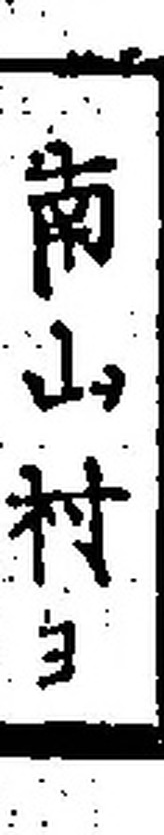南山村ヨ
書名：能登地誌略
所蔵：国立国会図書館 National Diet Library, JAPAN
